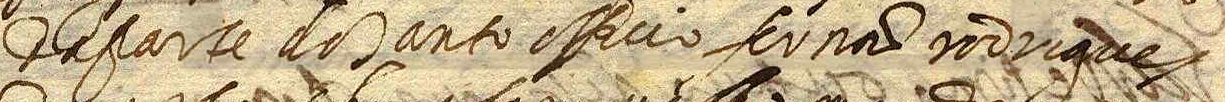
da parte do santo officio fernaõ rodrigues
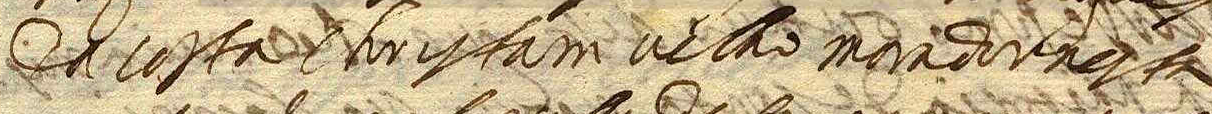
da costa christam uelho morador nesta
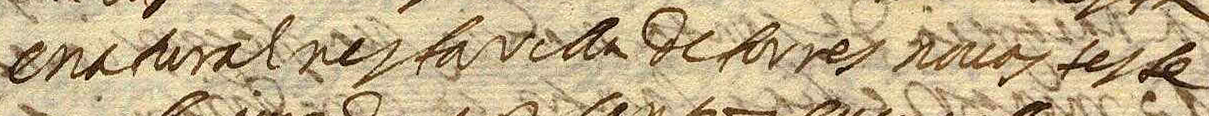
e natural nesta villa de torres nouas teste
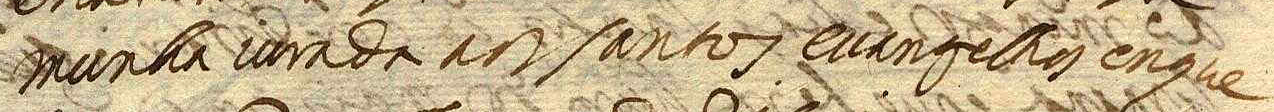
munha iurada aos santos euangelhos en que
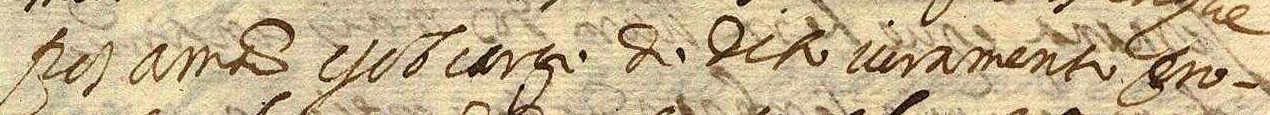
pos a maõ e sob cargo do dito iuramento pro
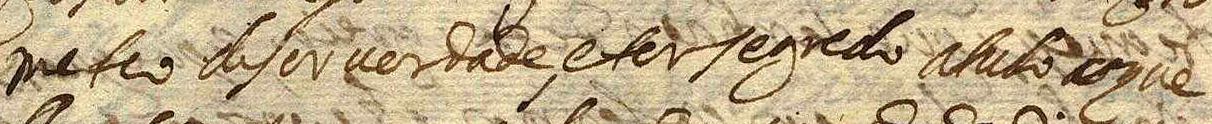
meteo diser uerdade, e ter segredo a tudo ao que
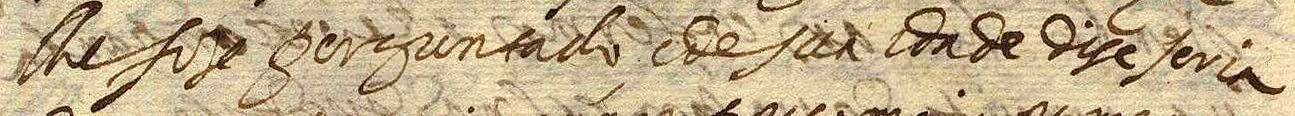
lhe fose perguntado, e de sua idade dise seria
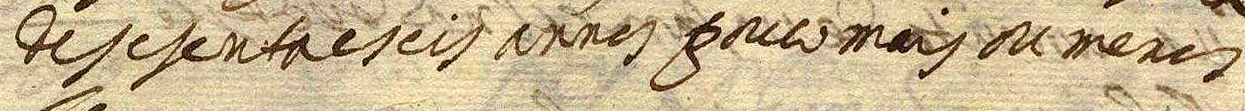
de sesenta e seis annos pouco mais ou menos
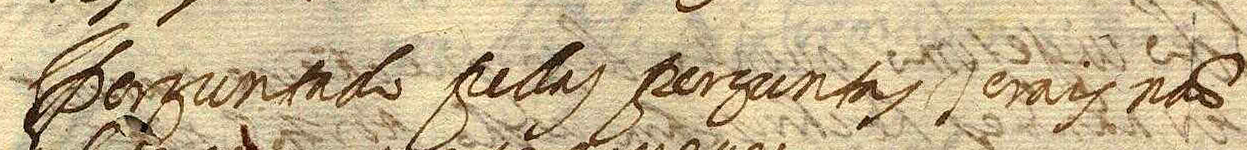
E perguntado pellas perguntas jerais naõ
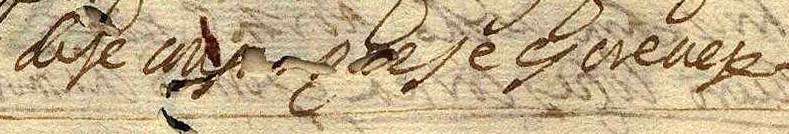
dise cous q_e se escreuese
